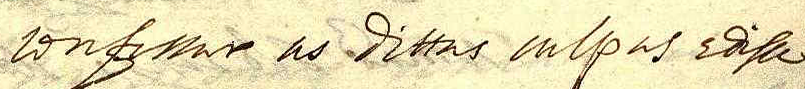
confessar as dittas culpas e disse
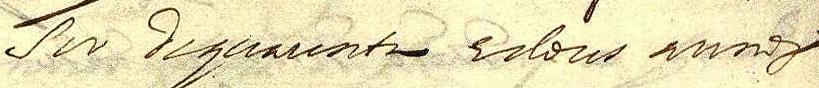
ser de quarenta e dous annos
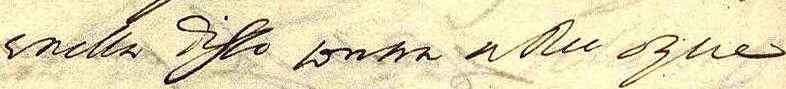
e nella disse contra a Ree o que
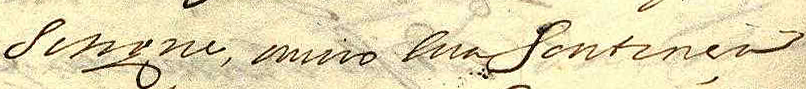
sengue, ouuio sua Sentença
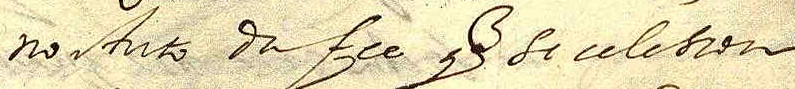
no Auto da fee q̄ se celebrou
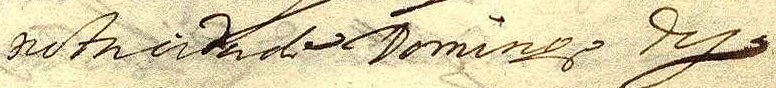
neta cidade Dominho des
